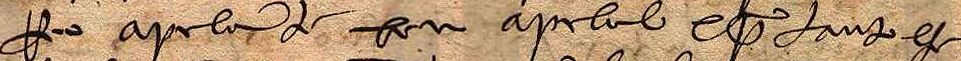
Reo apelāte bem apelado e p̄otanto lhe
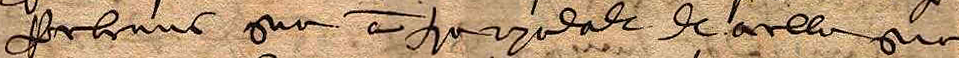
Recebemos sua c̄otraryadade de a ella sua
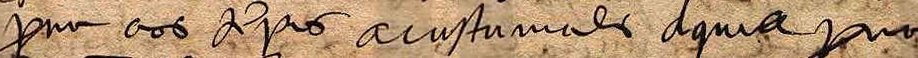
ꝓua aos tēpos acustumados A quall ꝓua
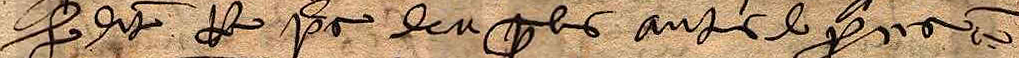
ho dito Reo p̄so deu p̄los autos do ꝓces c̄o
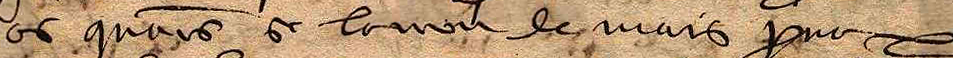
os quaes se lançou de mais ꝓua e
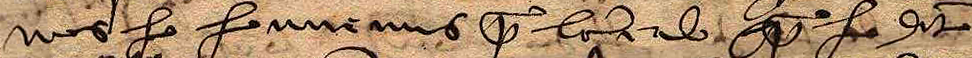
nos ho houuemos p̄o lāçado e p̄o ho dito
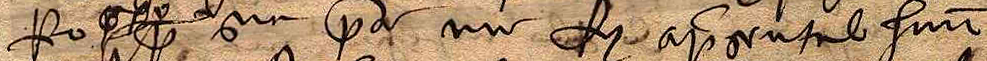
Reo p̄so p̄o sua p̄te me foy ap̄sentado huū
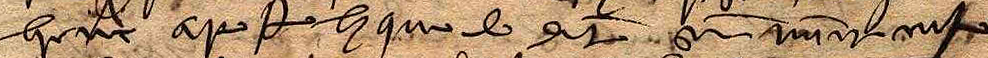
breue apostolyquo do dito sōr nūcyo cuJo
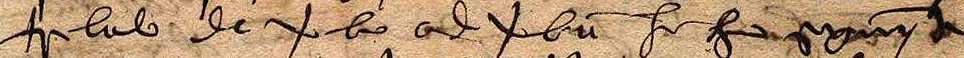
trelado de ꝟbo ad ꝟbū he ho seguȳte
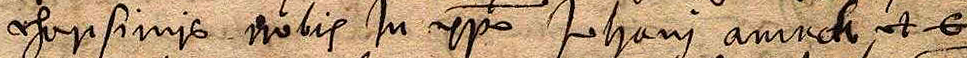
charisimjs nobis In xp̄o Johanj amadi et E
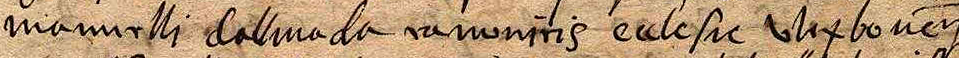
manuellj dallmada canonjcis ecclesie vlixbonēn
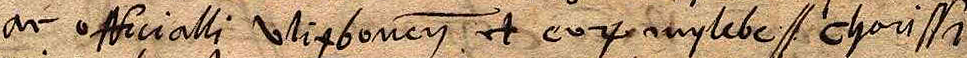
ac officialli vlixbonēn et eoꝝ cuylibe .//. Charissi
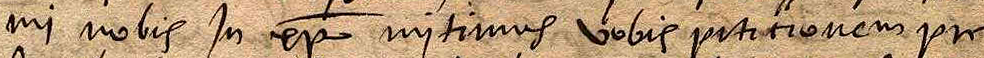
mj nobis Jn x̄po mjtimus vobis piticionem pre
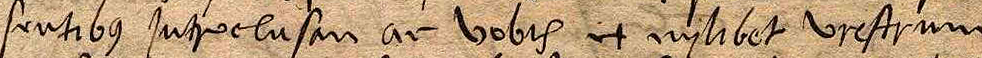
sentibꝯ Jntroclusam ac vobis et cujlibet vrestrum
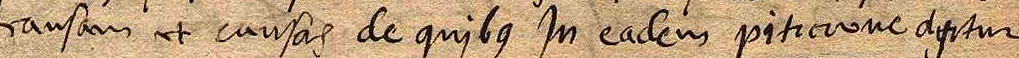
causam et causas de qujbꝯ Jn eadem piticione agitur
